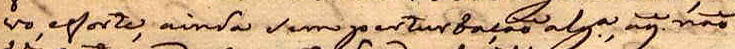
vo, e forte, ainda sem perturbaçaõ alg.a, a q̄ não
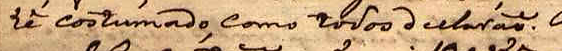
hé costumado, como todos declaraõ.
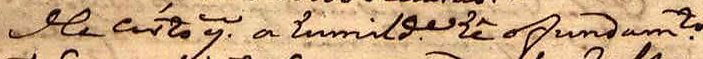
He certo q̄ a humild.e hé o fundam.to
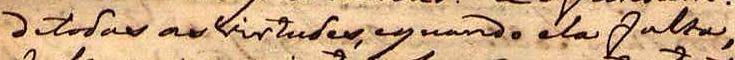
de todas as Virtudes, e quando ela falta,
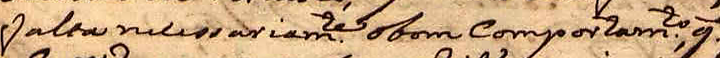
falta necessariam.te o bom comportam.to q̄
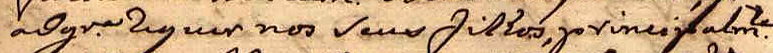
a Igr.a Requer nos seus filhos, principalm.te
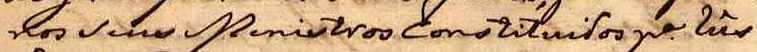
nos seus Menistros Constituidos p.a Reis
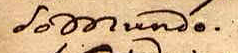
do Mundo.
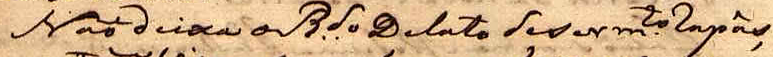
Naõ deixa o R.do Delato de ser m.to Rapás,
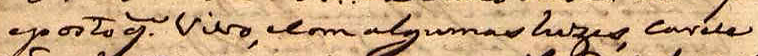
e posto q̄ Vivo, e com algumas luzes, carece
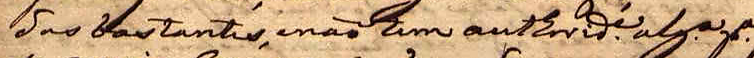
das bastantes, e naõ tem authorid.e alg.a p.a
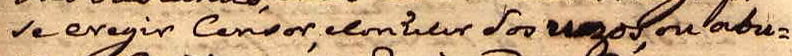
se eregir Censor, e conhecer dos uzos, ou abu
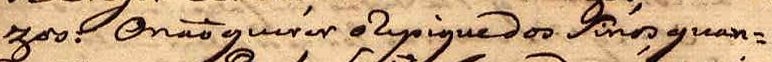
zos. E naõ querer o Repique dos Sinos, quan
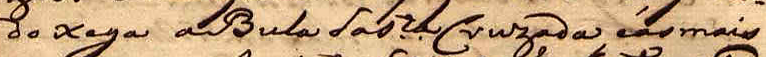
do xega a Bula da s.ta Cruzada, e as mais
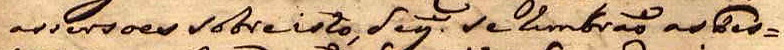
assersoes sobre isto, de q. se lembraõ as Pes
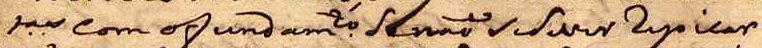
soas com o fundam.to de naõ se dever Repicar
